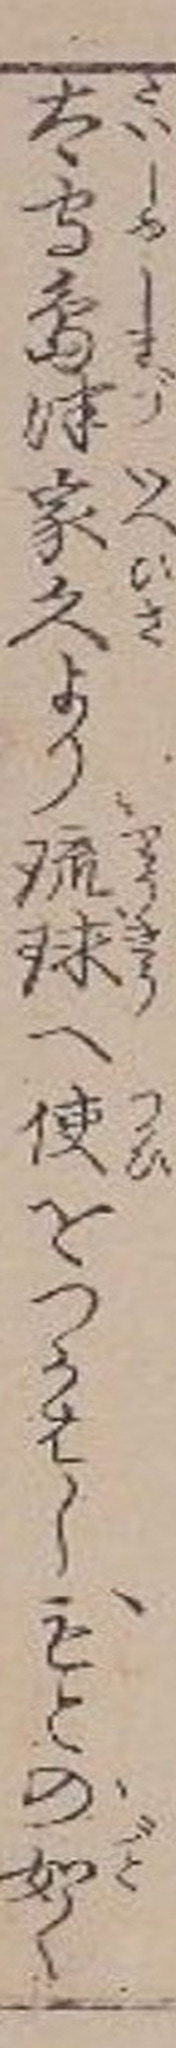太守島津家久より琉球へ使をつかはし、もとの如く
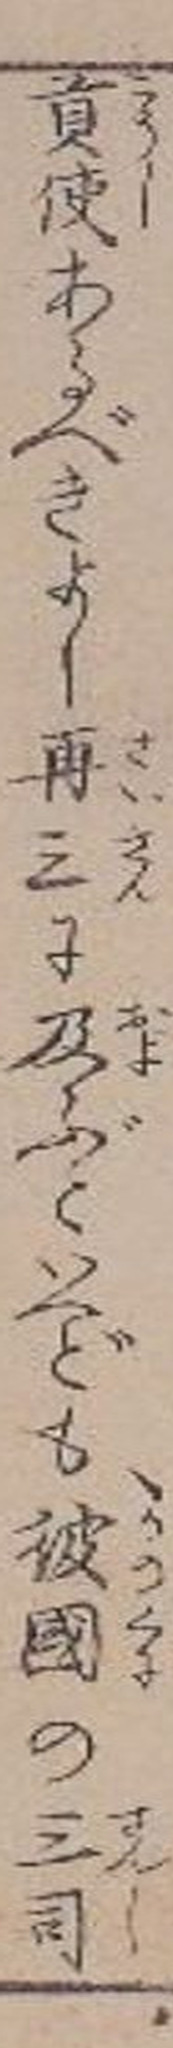貢使あるべきよし再三に及ぶといへども、彼国の三司

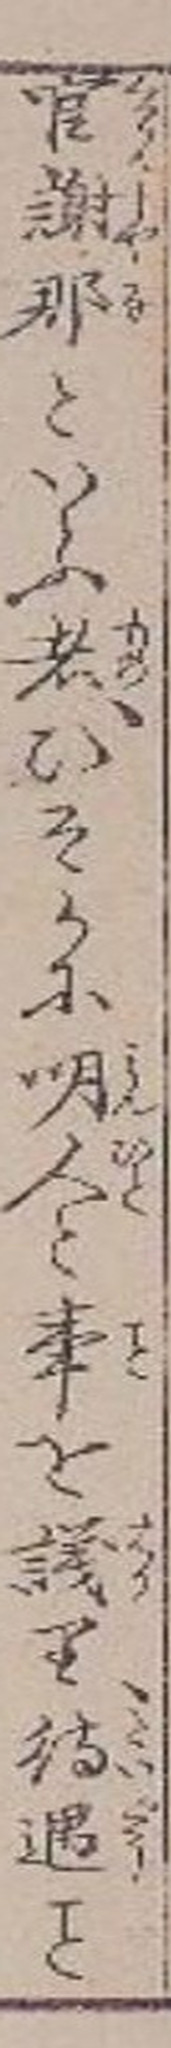官謝那といふ者、ひそかに明人と事を議り、待遇こと
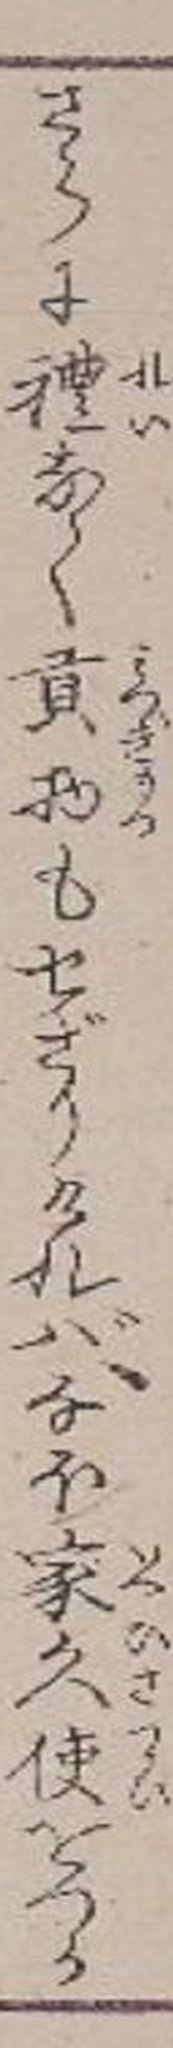さらに礼なく貢物もせざりければ、なほ家久使をつか
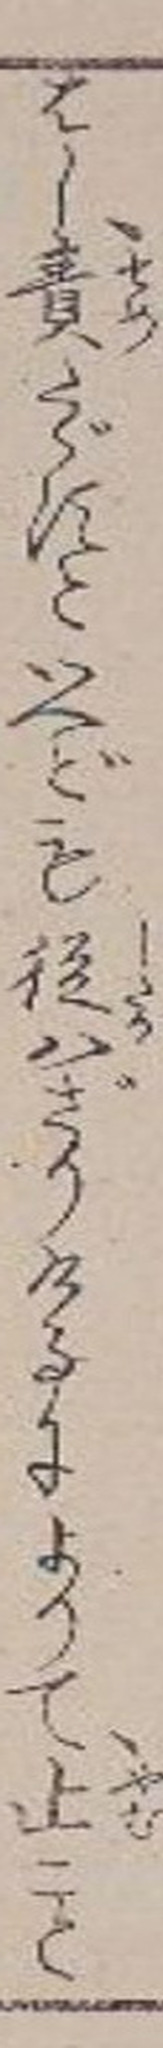はし、責たゞすといへども従はざりけるによりて、止こと
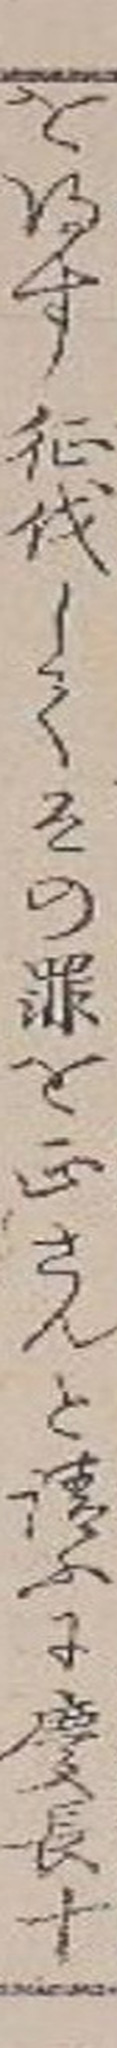を得す征伐して、その罪を正さんと請ふに、慶長十
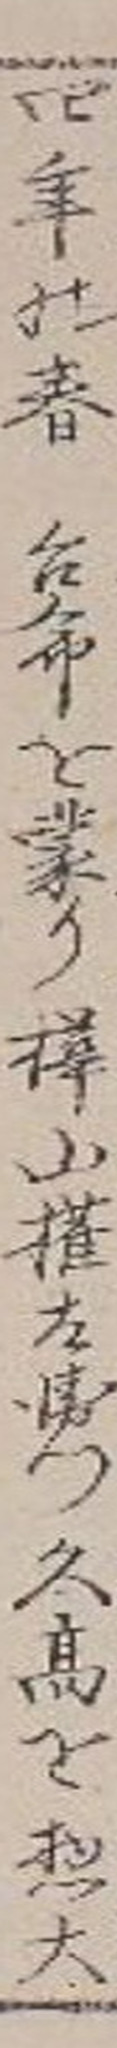四年の春台命を蒙り、樺山権左衛門久高を惣大
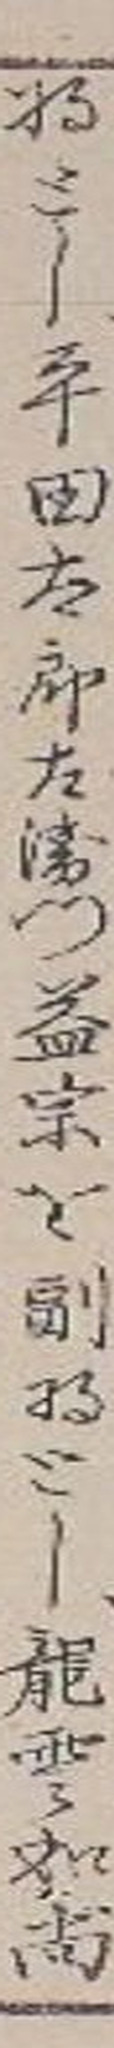将とし、平田太郎左衛門益宗を副将とし、龍雲和尚
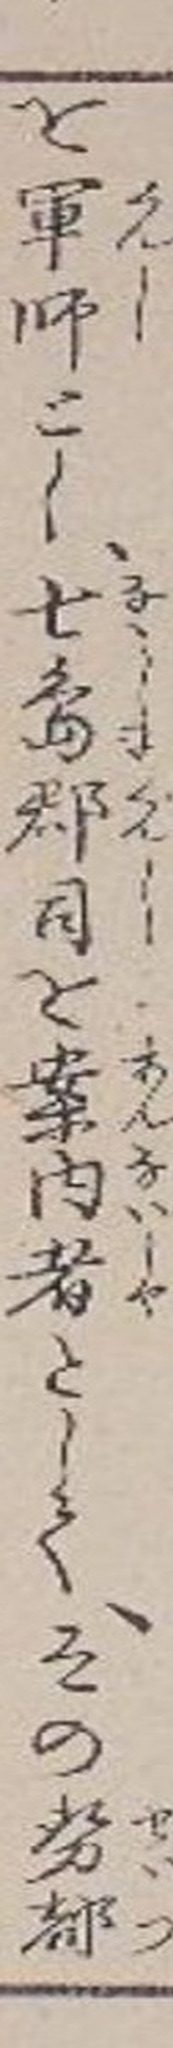を軍師とし、七島郡司を案内者として、その勢都
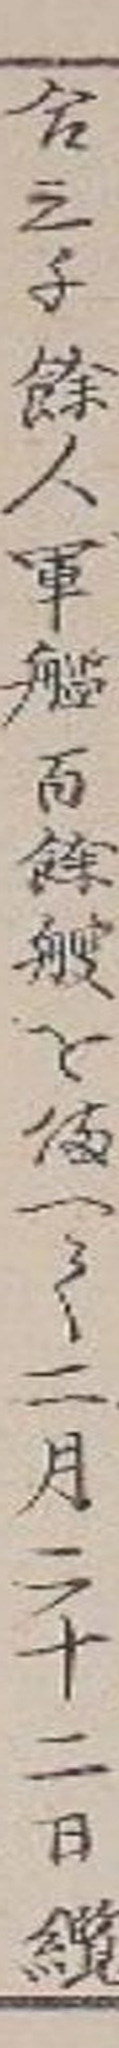合三千余人、軍艦百余艘を備へて、二月二十二日纜
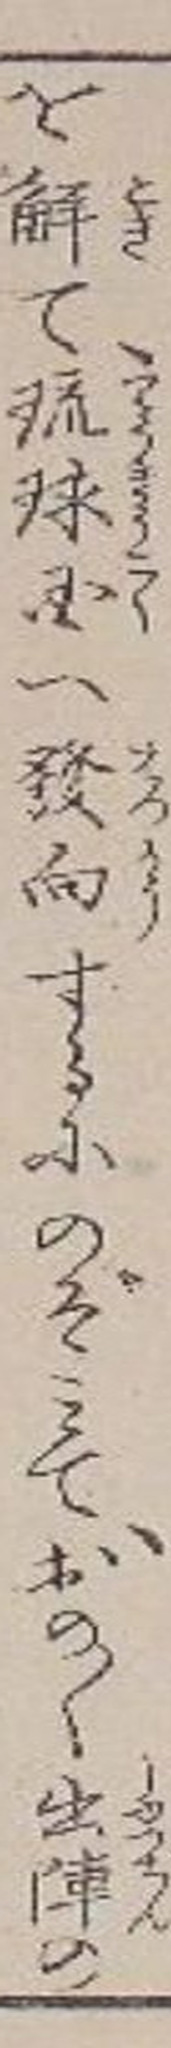を解て、琉球国へ発向するにのぞみて、おの〳〵出陣の
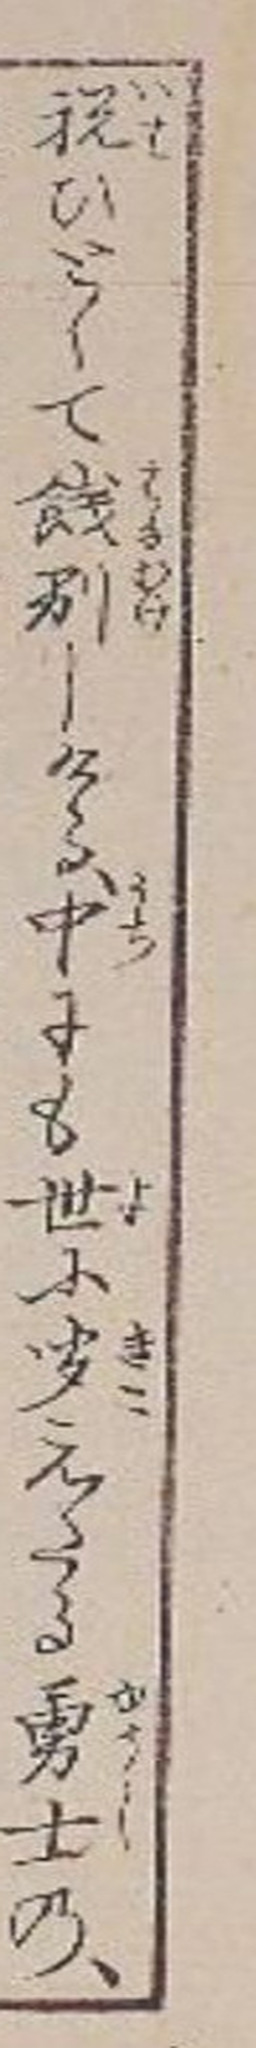祝ひとして餞別しける、中にも世に聞えたる勇士の、
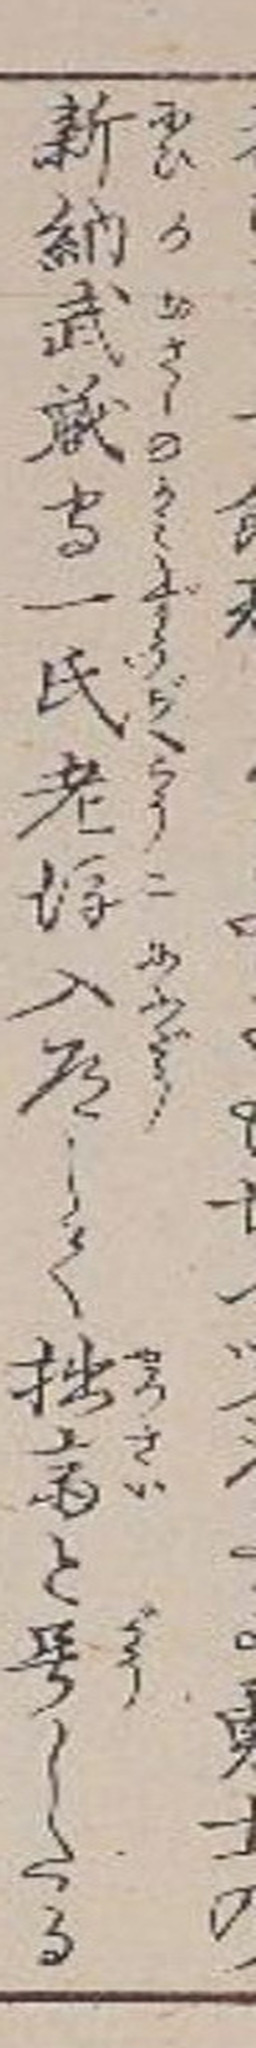新納武蔵守一氏、老後入道して拙斉と号したる
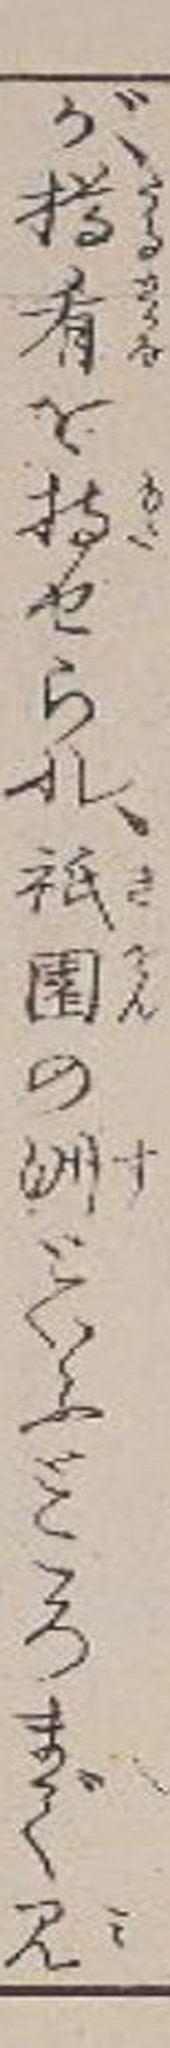が、樽肴を持せられ、祇園の洲といふところまで見
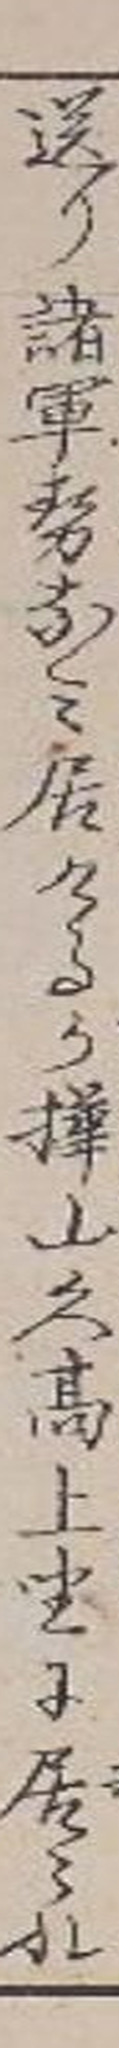送り、諸軍勢なみ居けるが、樺山久高上坐に居られ
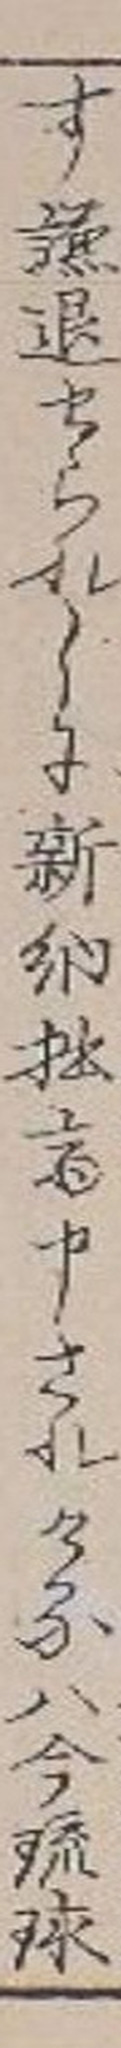ず謙退せられしに、新納拙斉申されけるは、今琉球
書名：琉球入貢紀略
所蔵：University of the Ryukyus Library
